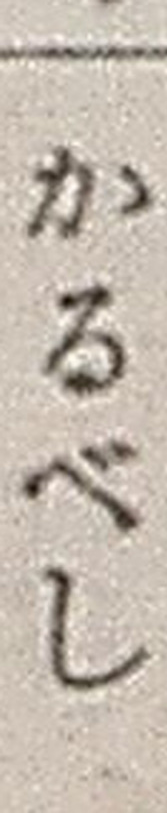かるべし
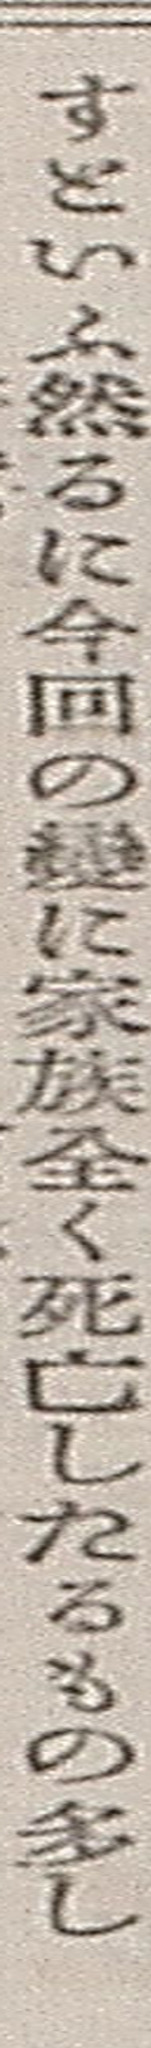すといふ然るに今回の変に家族全く死亡したるもの多し
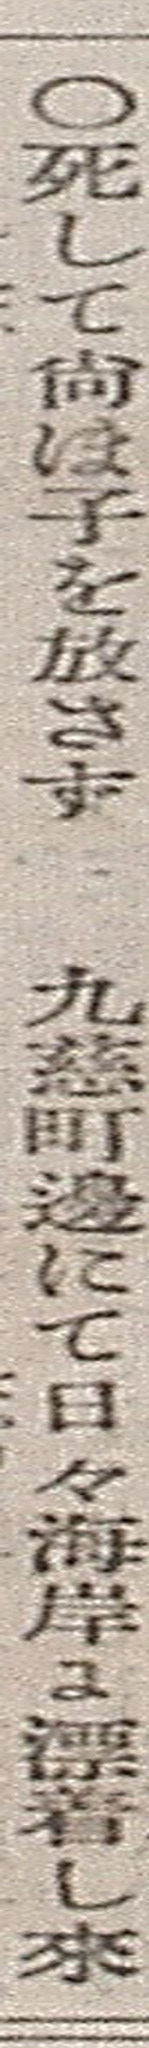〇死して尚ほ子を放さず久慈町辺にて日々海岸に漂着し来
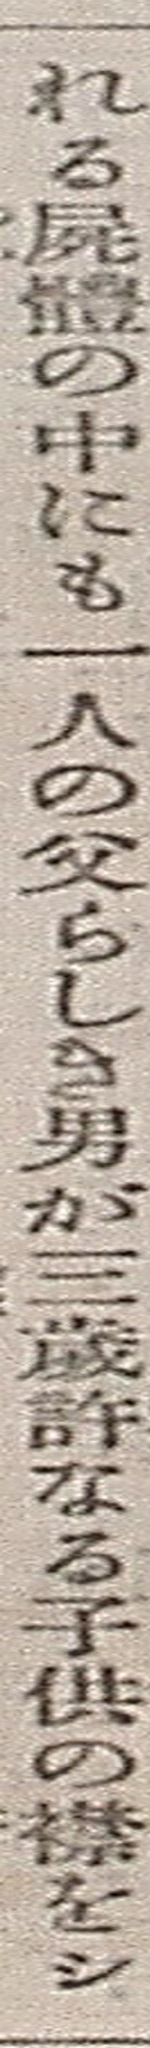れる屍体の中にも一人の父らしき男が三歳許なる子供の襟をシ
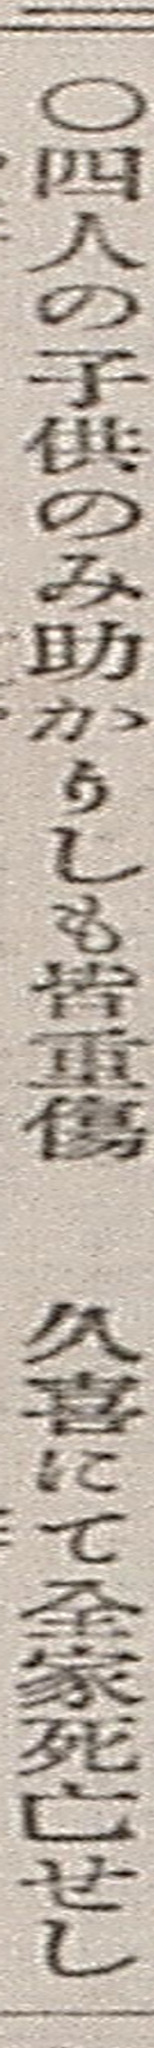〇四人の子供のみ助かりしも皆重傷久喜にて全家死亡せし
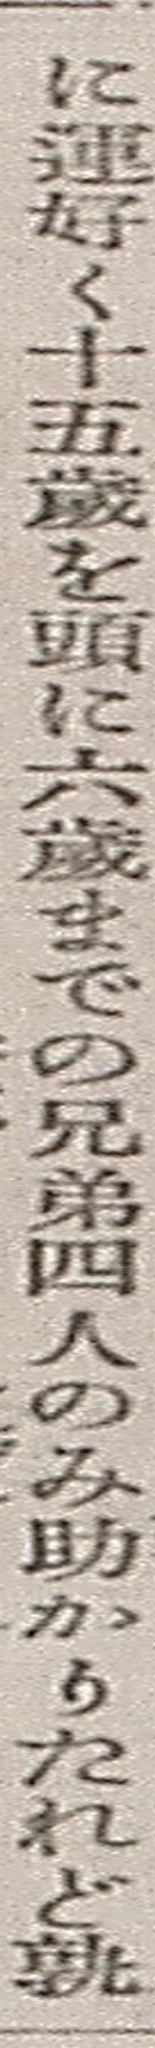に運好く十五歳を頭に六歳までの兄弟四人のみ助かりたれど孰
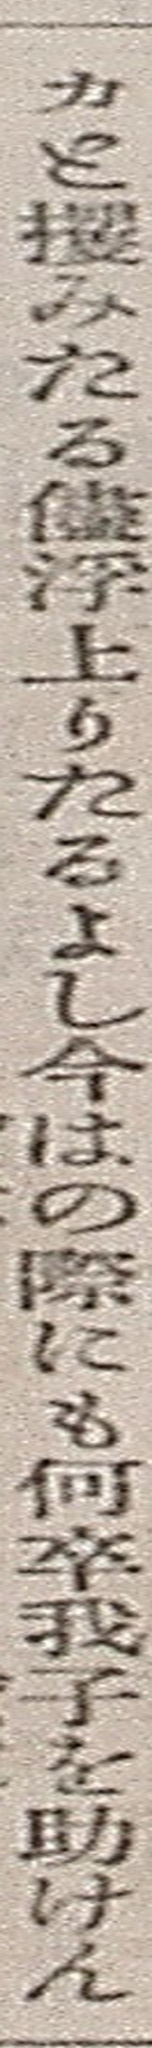カと攫みたる侭浮上りたるよし今はの際にも何卒我子を助けん
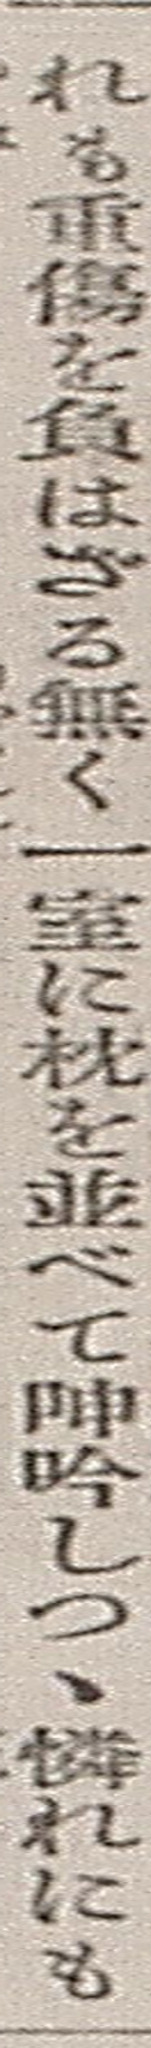れも重傷を負はざる無く一室に枕を並べて呻吟しつゝ憐れにも
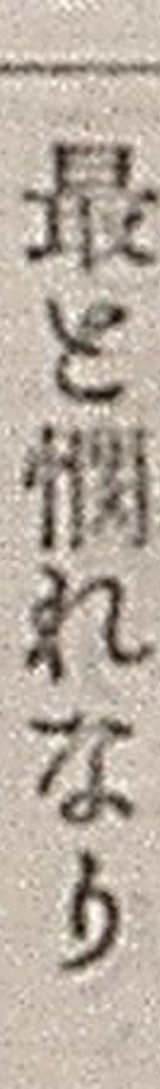最と憫れなり
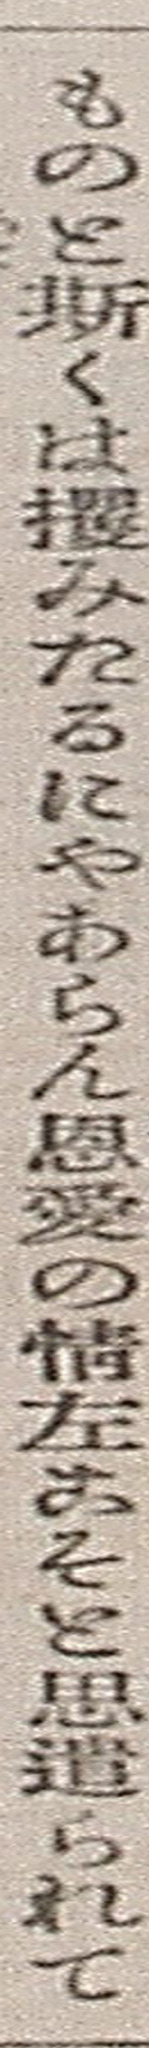ものと斯くは攫みたるにやあらん恩愛の情左こそと思遣られて
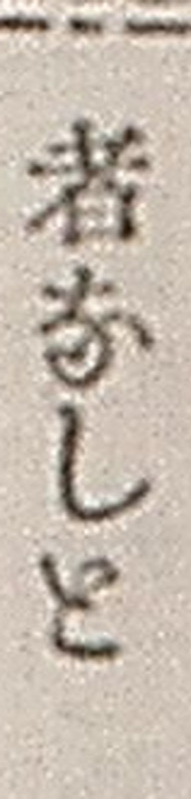者なしと
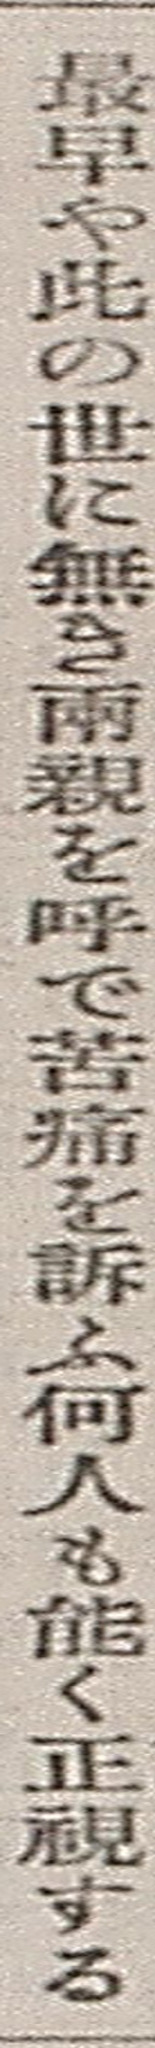最早や此の世に無き両親を呼で苦痛を訴ふ何人も能く正視する
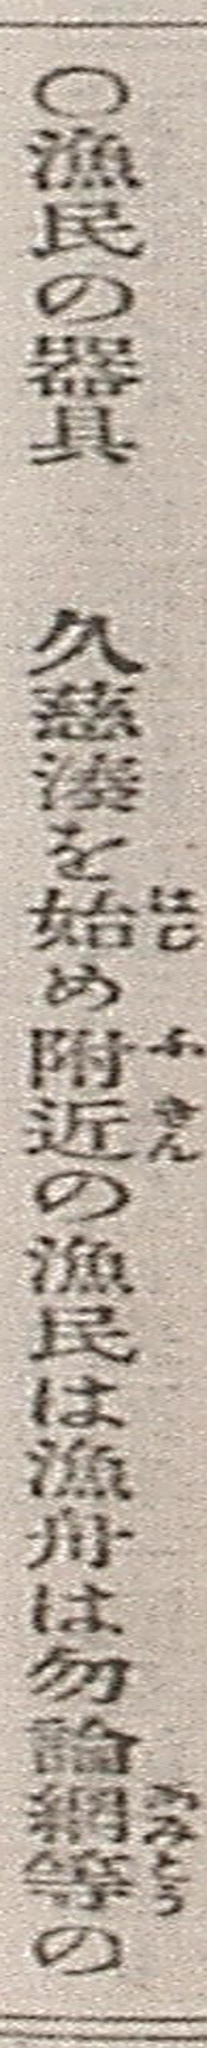〇漁民の器具久慈湊を始め付近の漁民は漁舟は勿論網等の

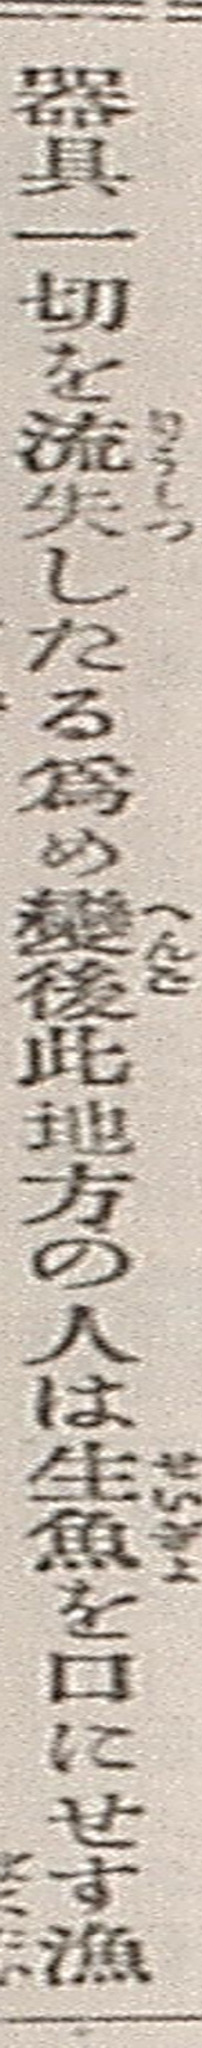器具一切を流失したる為め変後此地方の人は生魚を口にせす漁
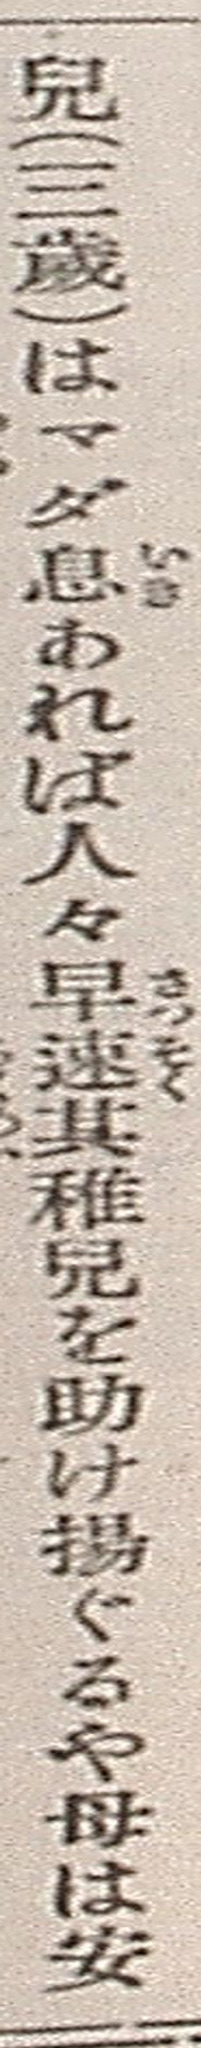児はマダ息あれば人々早速其稚児を助け揚ぐるや母は安
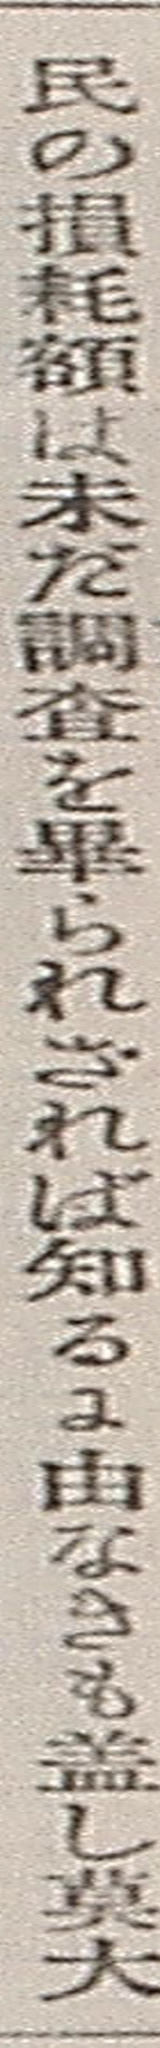民の損耗額は未だ調査を畢らざれば知るに由なきも蓋し莫大
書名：風俗畫報臨時増刊第百十九號　大海嘯被害録（中）
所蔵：東京大学地震研究所図書室 Earthquake Research Institute Library, The University of Tokyo, JAPAN
